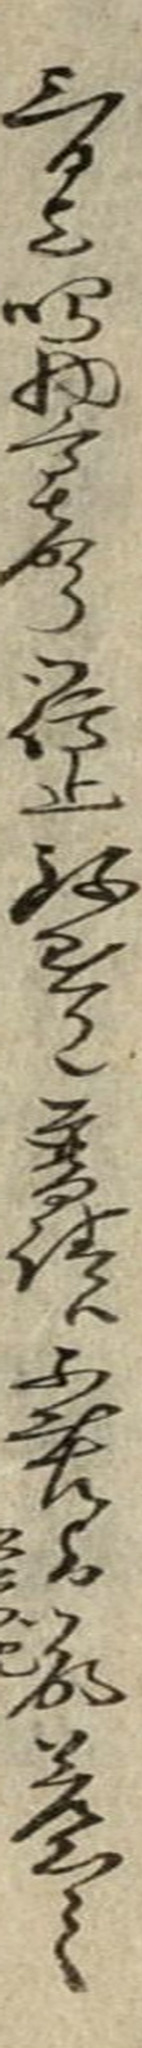三日迄鳴物高声御停止致懸り之普請は不苦旨御触差出之
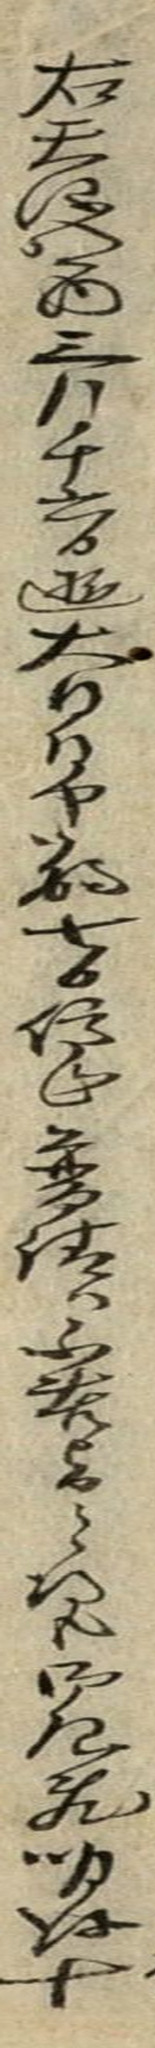右天保八酉三月十六日逝大目付中御触七日停止普請は不苦旨に候得共御屋敷明後十
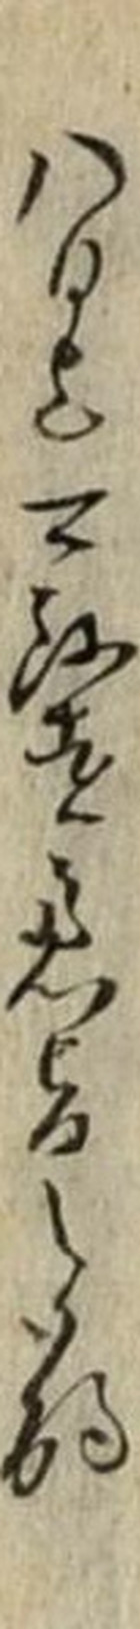八日迄可致遠慮旨之御触
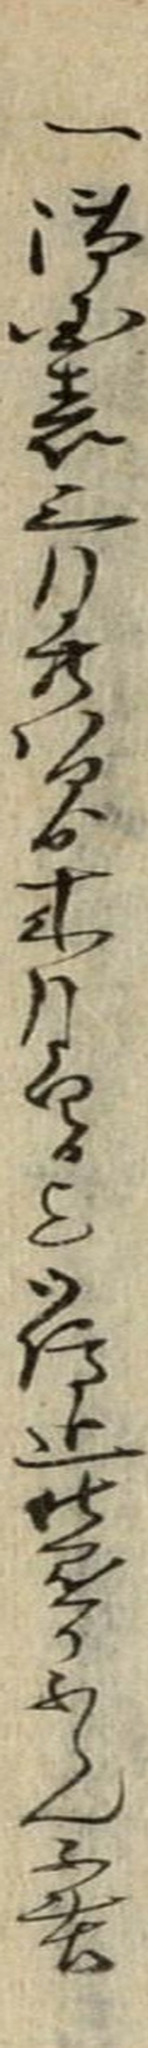一御国表三月廿八日ゟ来月四日迄御停止仕懸りふしん不苦
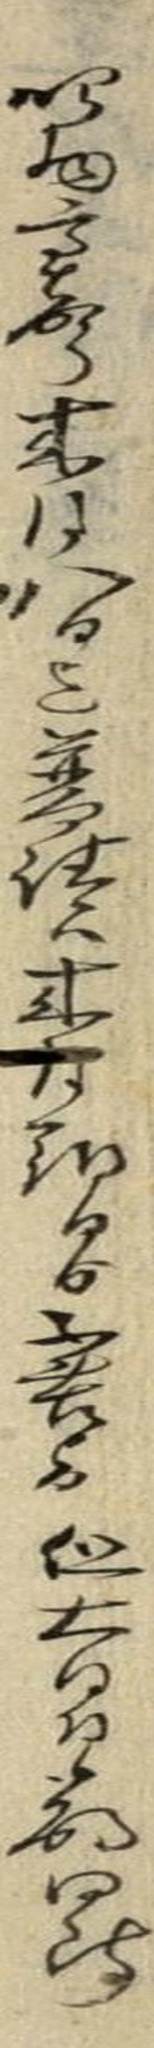鳴物高声来月八日迄普請は来月朔日ゟ不苦旨但大目付御触同断
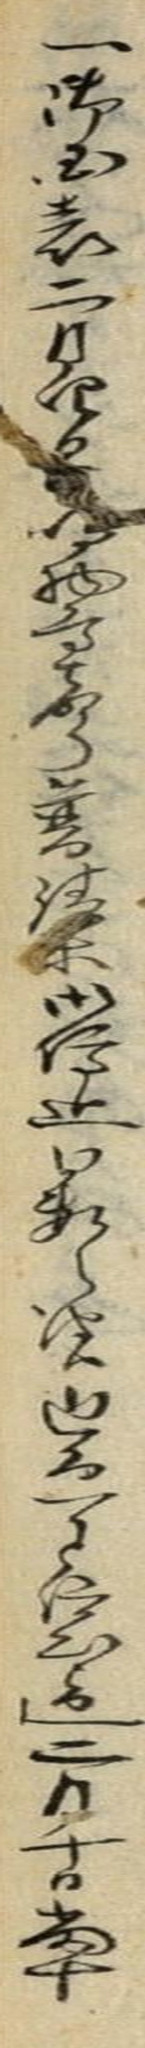一御国表二月四日ゟ鳴物高声普請等御停止日数之儀は追て可被仰出旨」二月十日当十
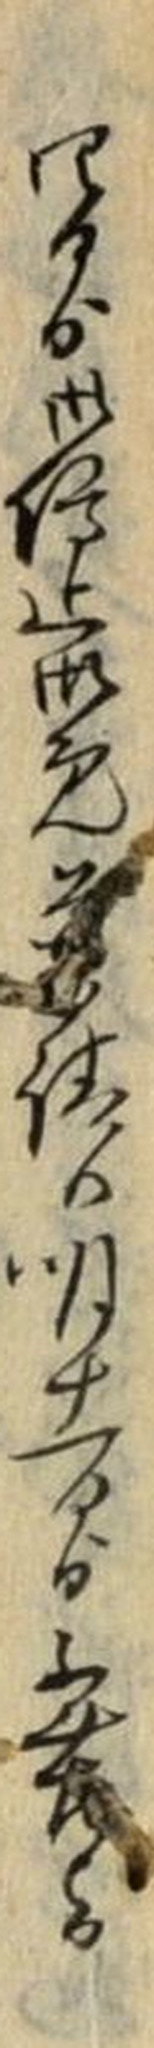四日ゟ御停止御免普請は明十一日ゟ不苦旨
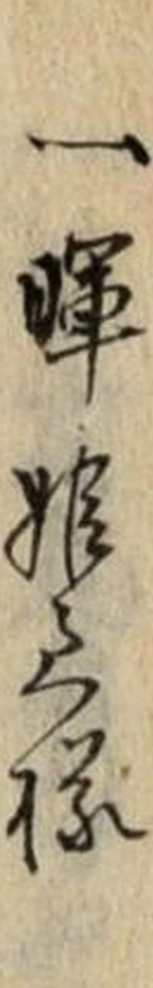一暉姫君様
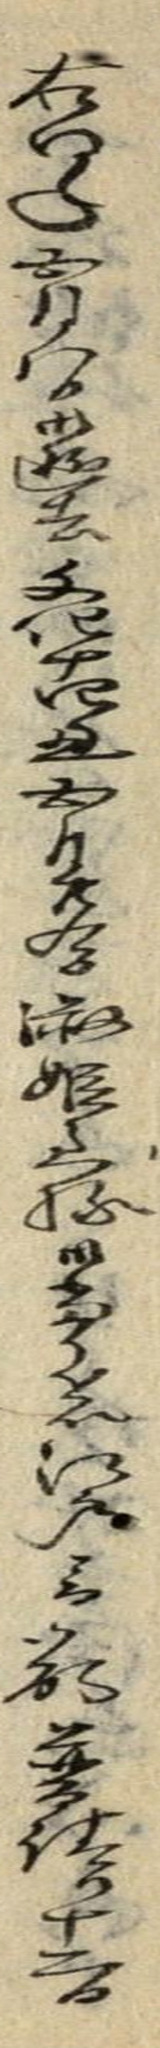右同年五月八日御逝去文化十四丑五月廿九日淑姫君様御当りを以江戸にて御触普請は十二日
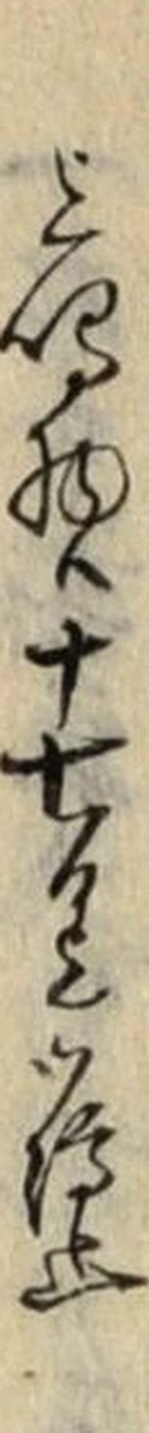迄鳴物は十七日迄御停止
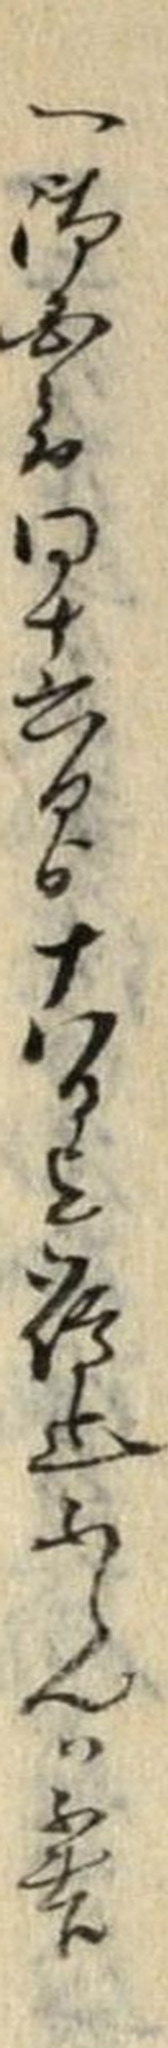一御国にて同十六日ゟ十八日迄御停止ふしんは不苦
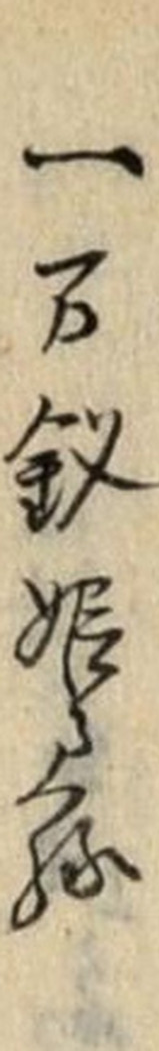一万釵姫君様
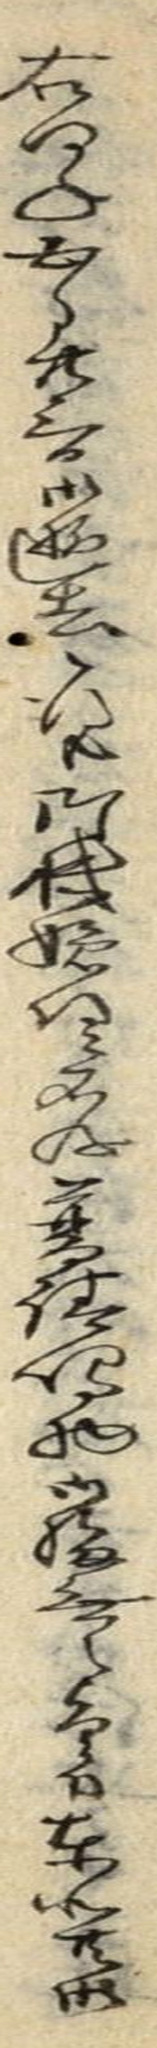右同年五月廿三日御逝去候得共御機嫌伺に不及普請鳴物御構無之旨に付東北共御
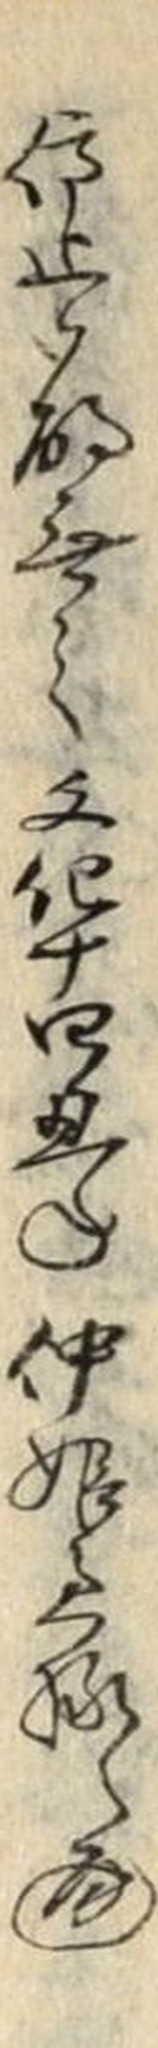停止御触無之文化十四丑年仲姫君様之通
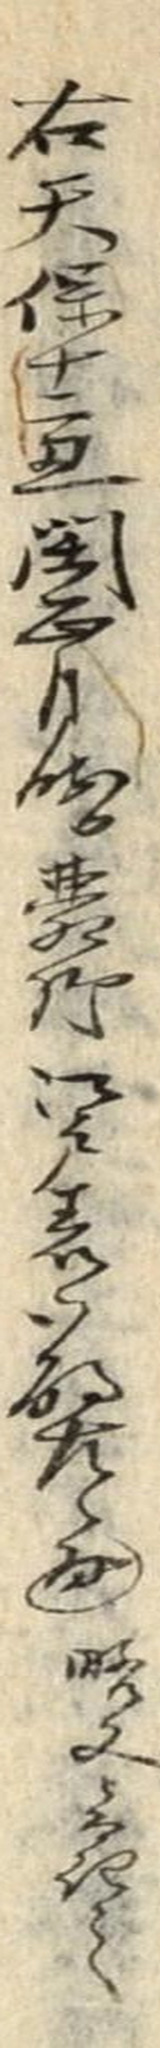右天保十二丑閏正月晦日薨御江戸表御触左之通略文にて記之
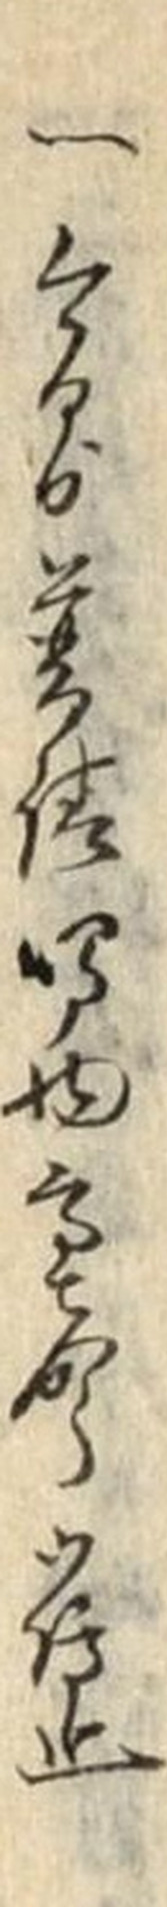一今日ゟ普請鳴物高声御停止
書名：御停止異変死失
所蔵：福井県文書館 Fukui Prefectural Archives
